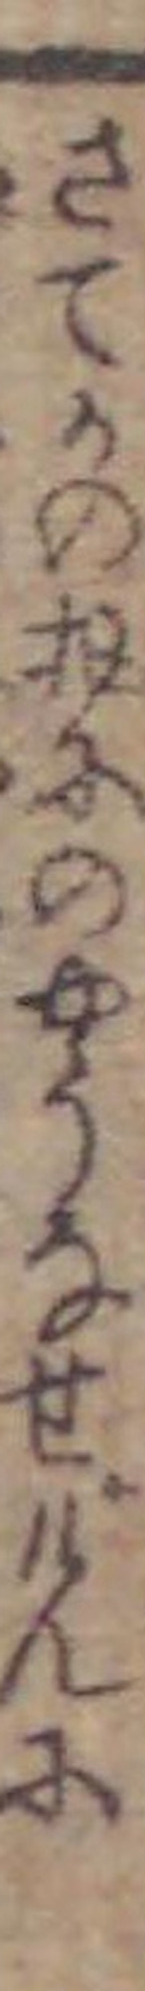さてかのおにのやうなぜげんに
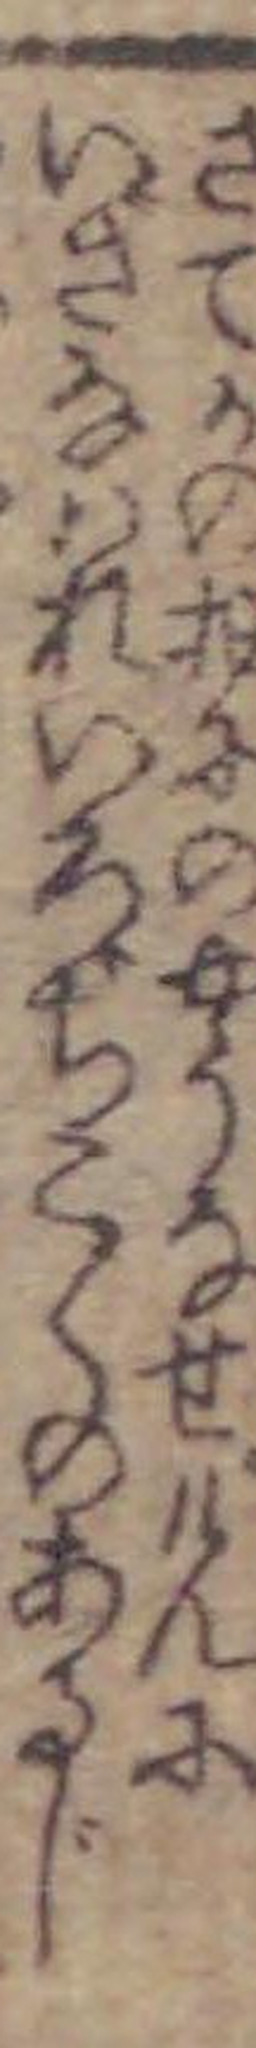いざなはれいろぢこくのあるじ
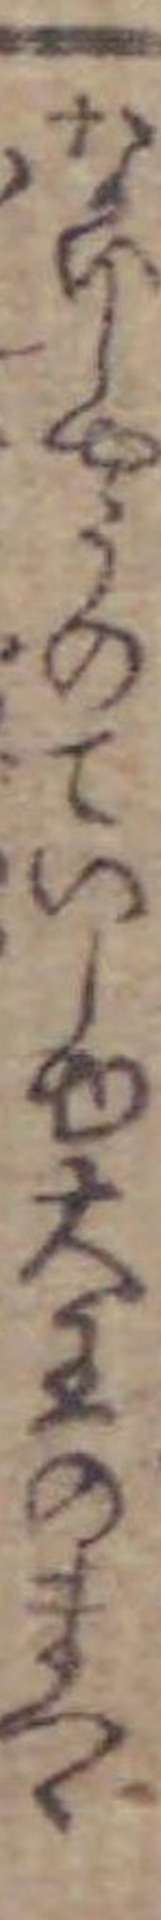ないしやうのていしゆ大王のまへゝ
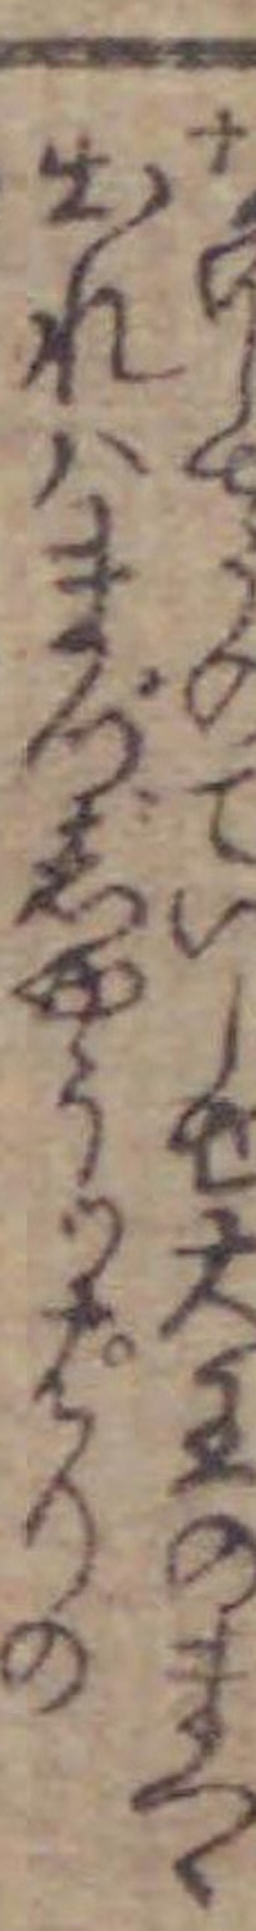出れはまづじやうッぱりの
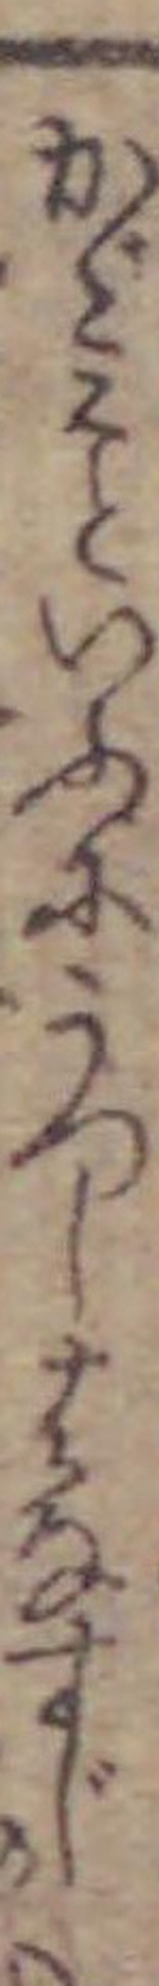かゞみといふにうつしはなすじか
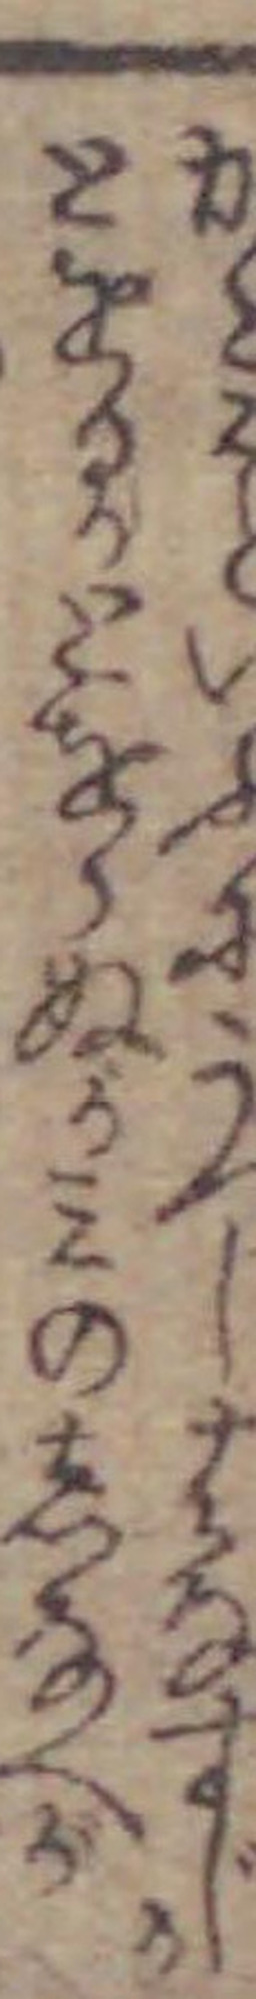とをるかとをらぬかみのしなへが
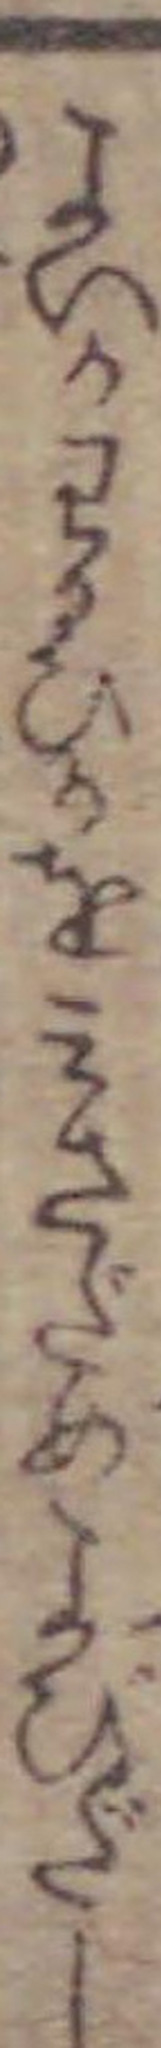よいかわるひかをみさだめよびだし
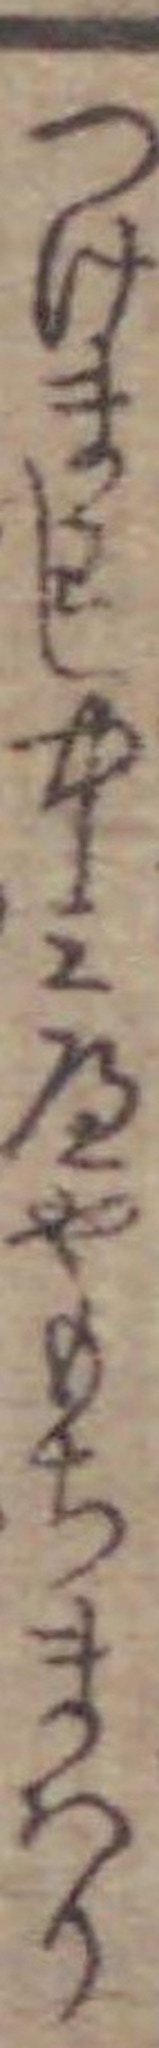つけまわし中三へやもちまはり
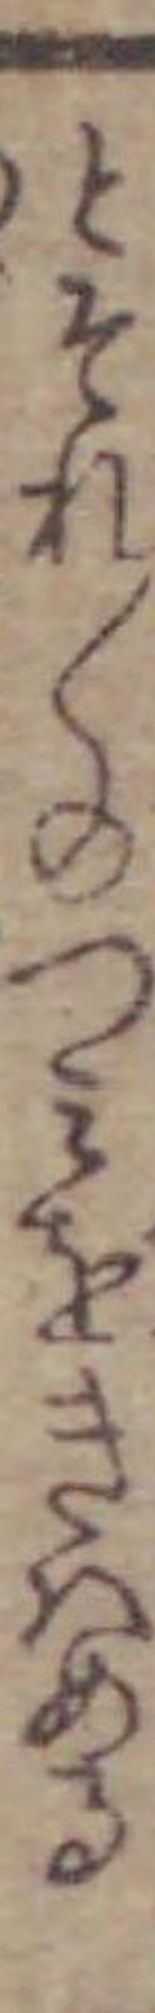とそれ〳〵のつみをきはめる
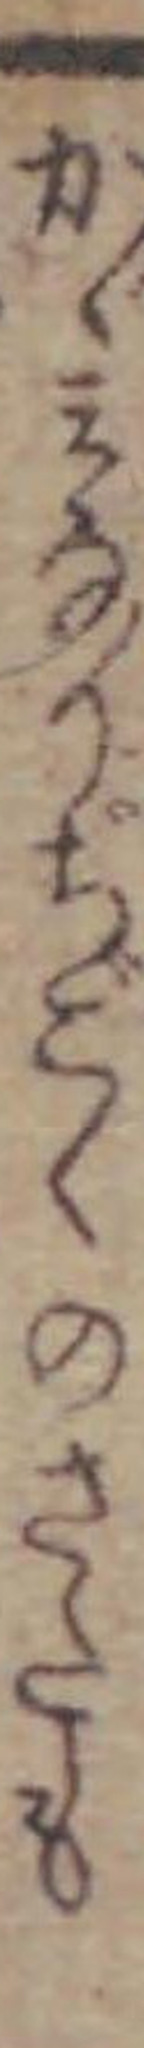かゞみなりぢごくのさたも
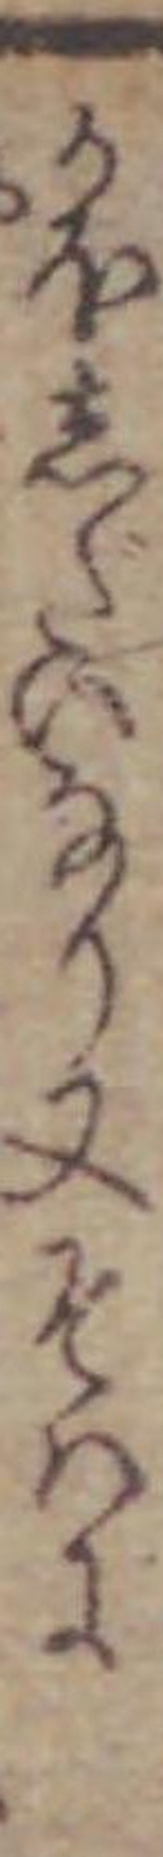かほしだいなり又そはに
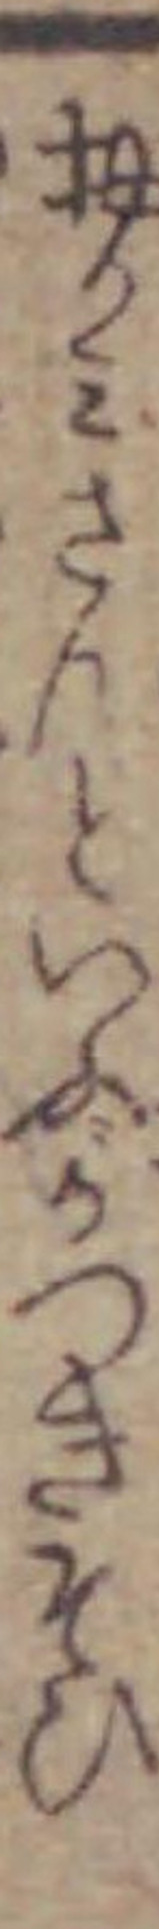おかみさんといふがつきそひ
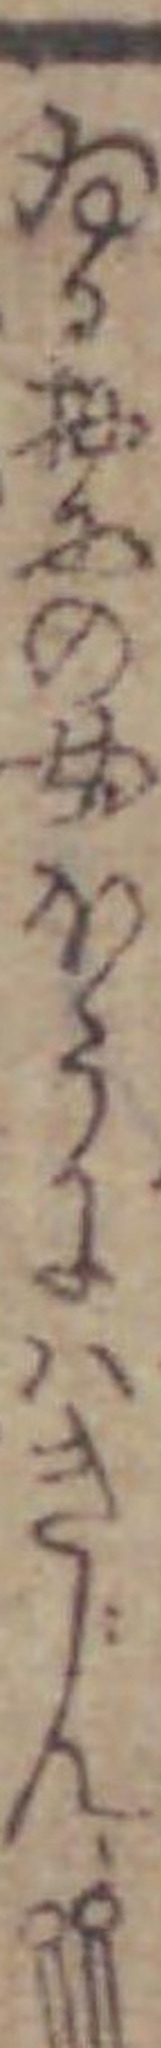ゐるおにの女ほうにはきじん
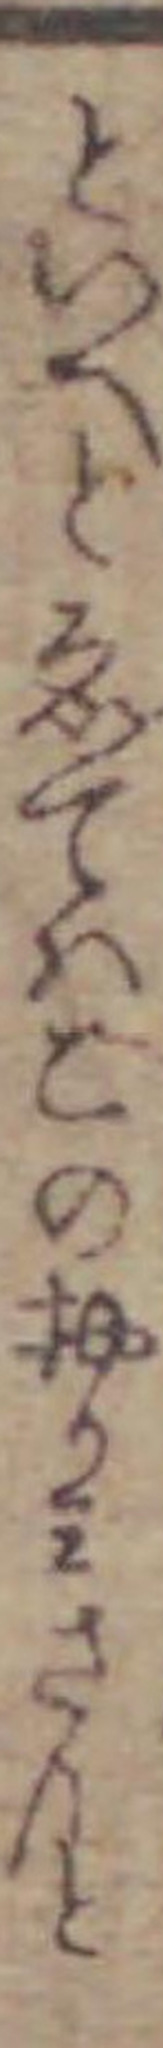といへどゑてはこのおかみさんと
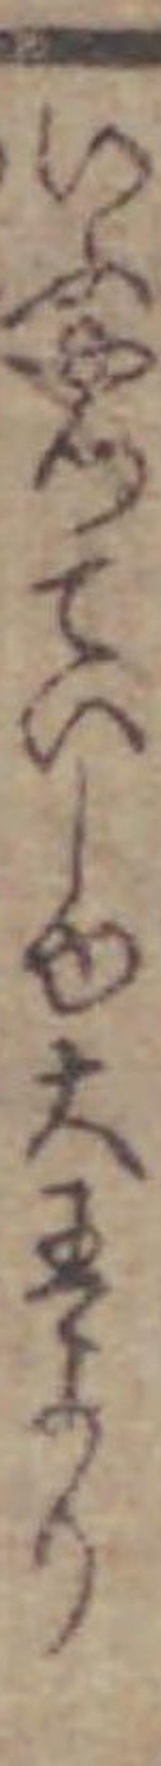いふやつていしゆ大王より
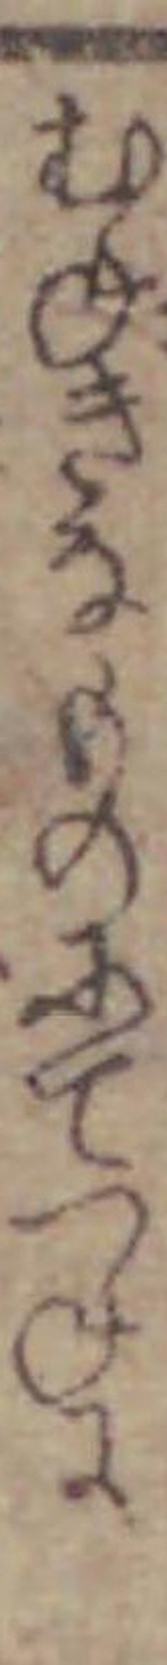むねきなものにてつねに
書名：九替十年色地獄 : 3巻
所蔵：国立国会図書館 National Diet Library, JAPAN
